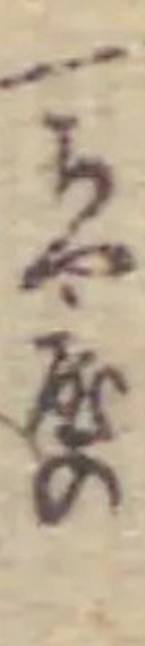ちや屋の
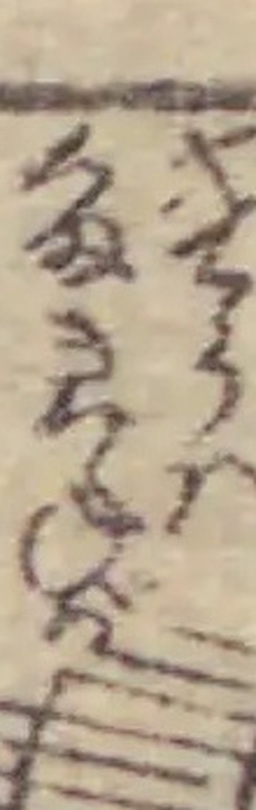くまきつねが
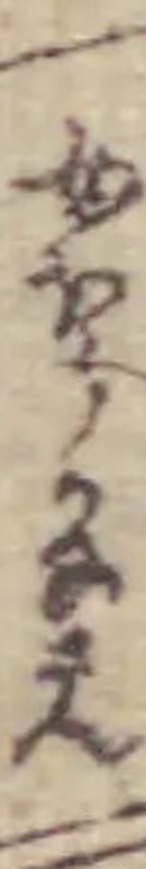女ほうかなさん
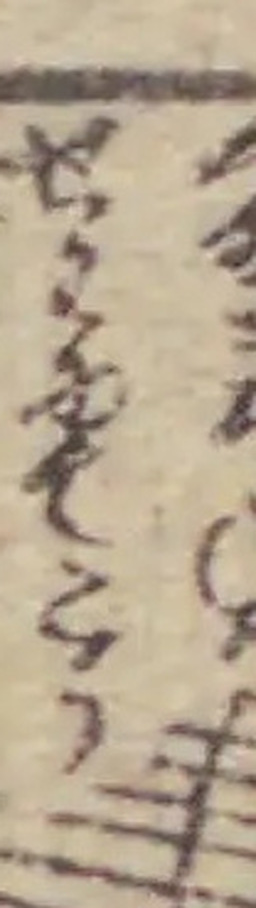せわにてこう
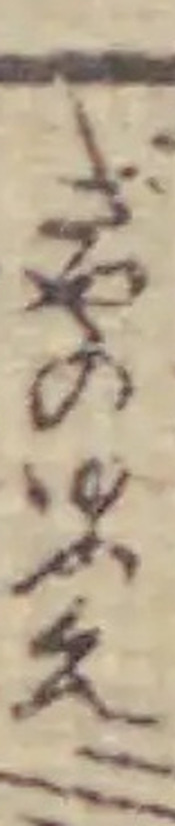ぎやのゆふくん
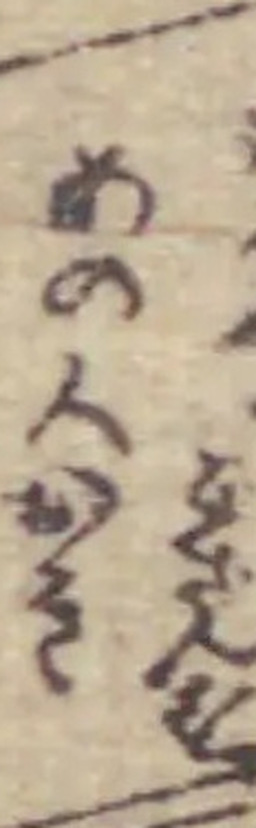あの人おき
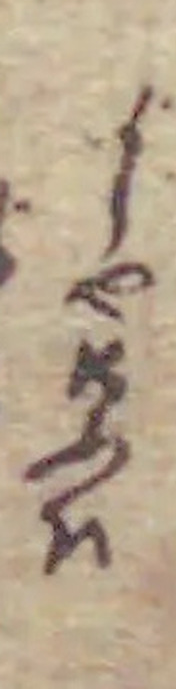よしやけふは
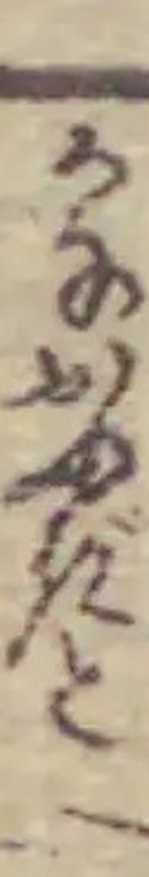かなおふぎと
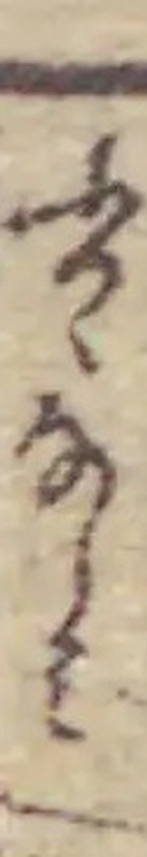ふかくなしみ
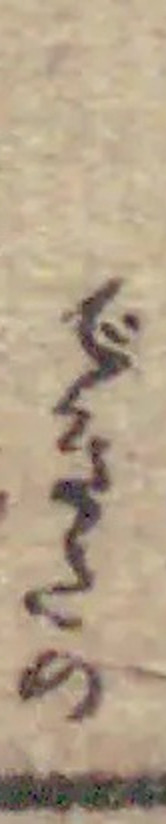できたの
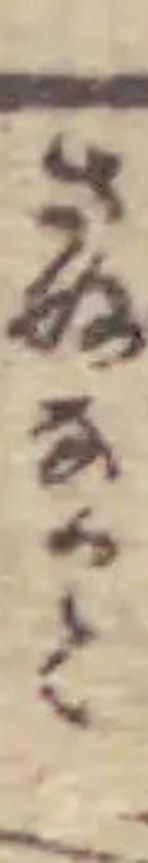さぬなかと
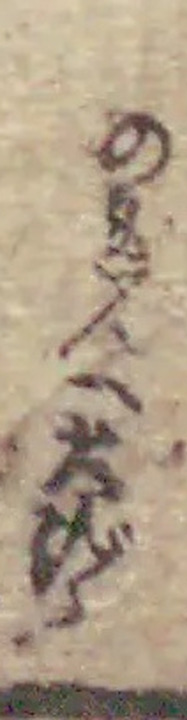のれんへ大びら
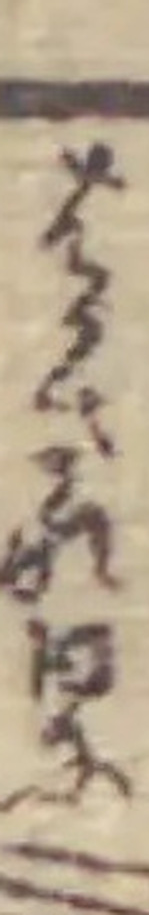はかされ日に
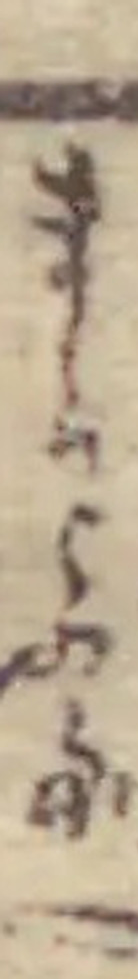ましかよふ事
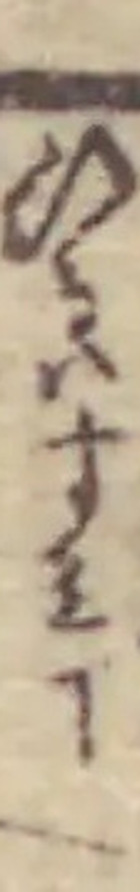ひるはすみ丁
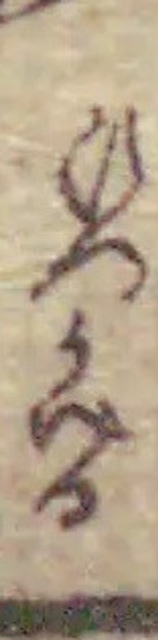ひつかける
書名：夜野中狐物 2巻
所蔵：国立国会図書館 National Diet Library, JAPAN
